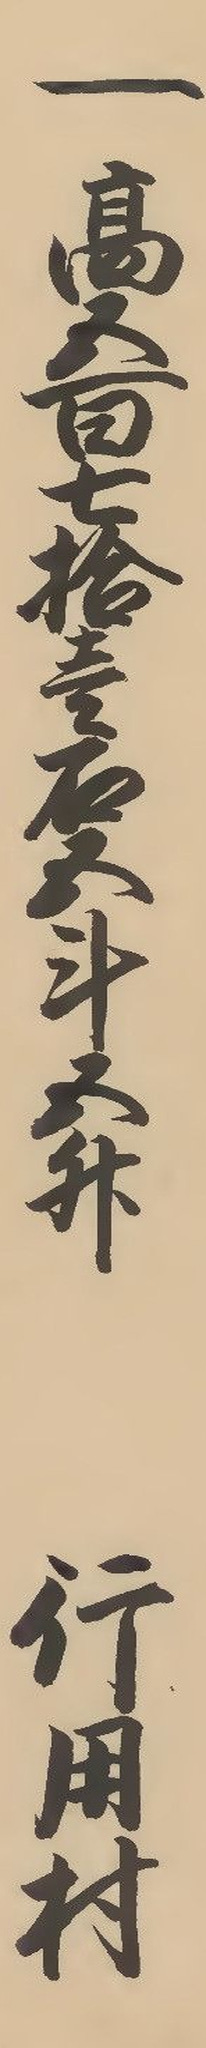一高五百七拾壱石五斗五升行用村
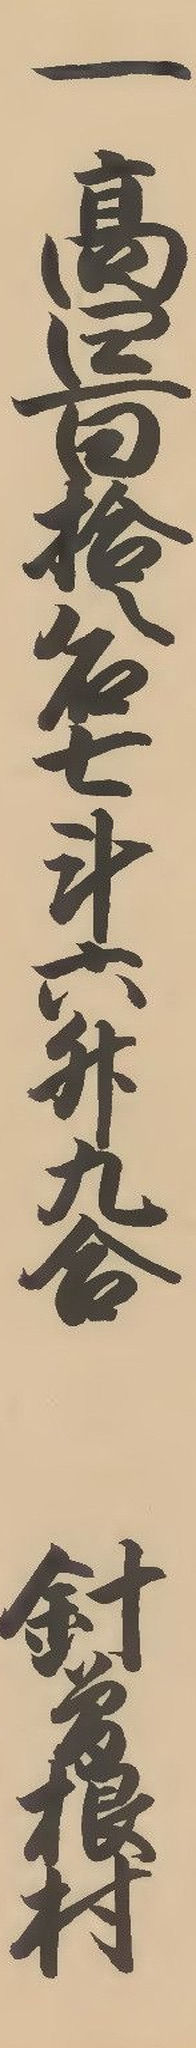一高四百拾八石七斗六升九合針曽根村
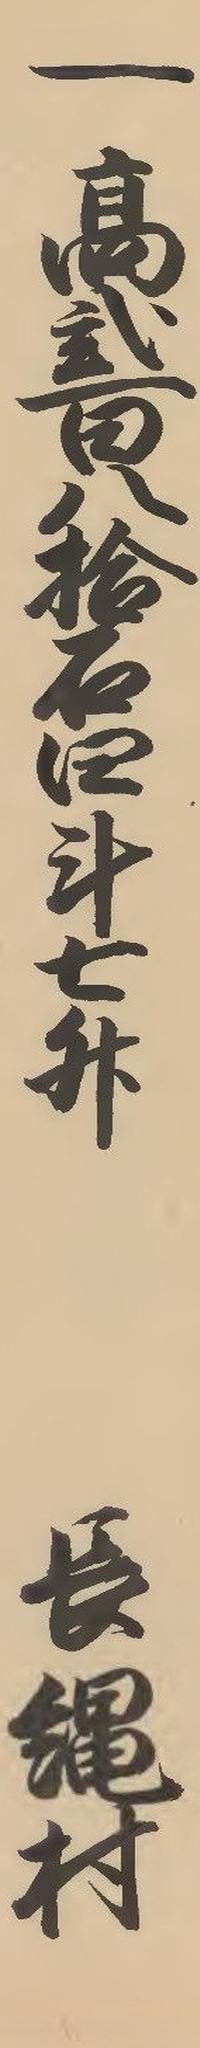一高弐百八拾石四斗七升長縄村
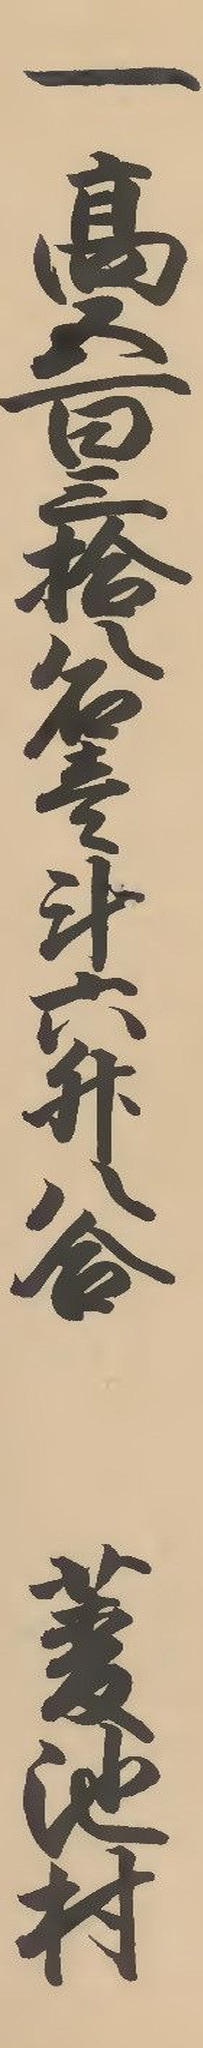一高五百三拾八石壱斗六升八合菱池村
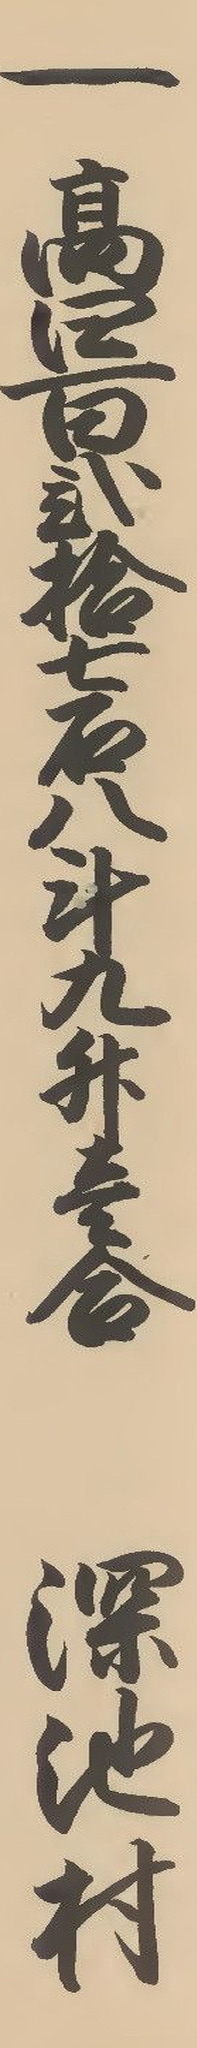一高四百弐拾七石八斗九升壱合深池村
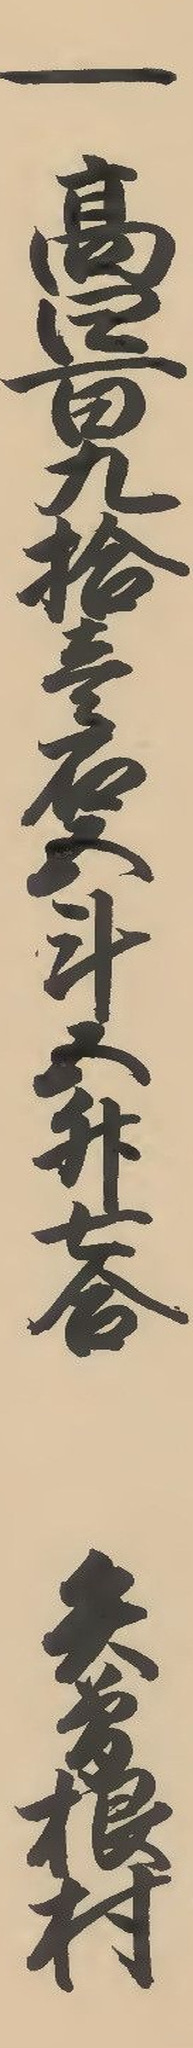一高四百九拾壱石五斗五升七合矢曽根村
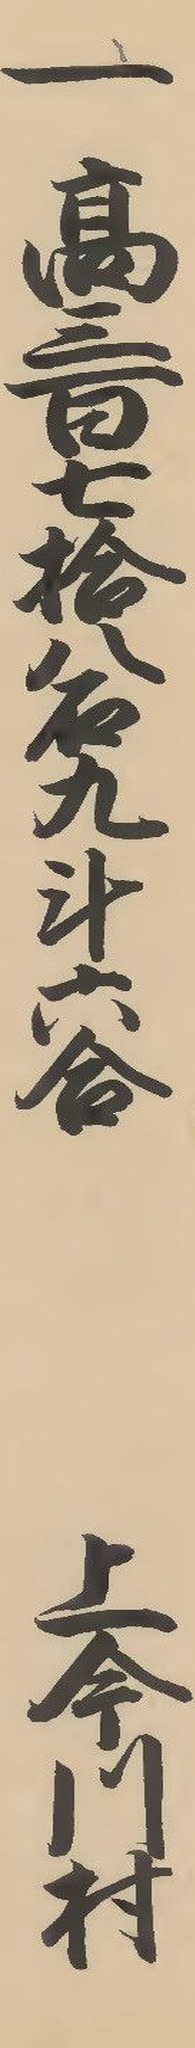一高三百七拾八石九斗六合上今川村
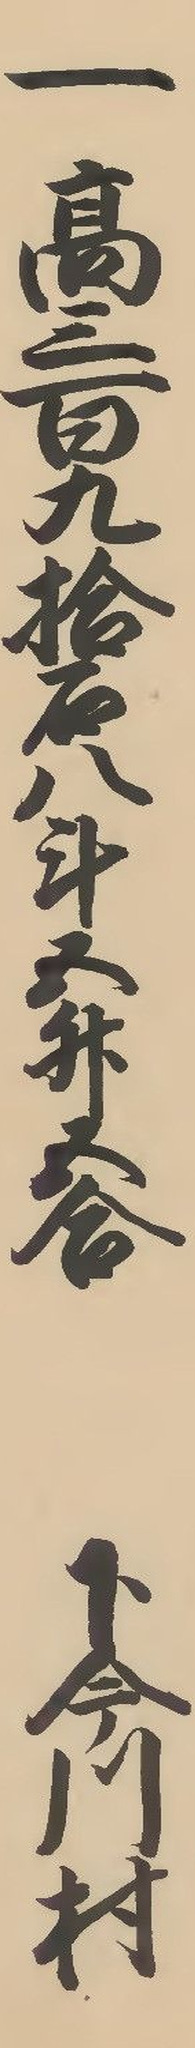一高三百九拾石八斗五升五合下今川村

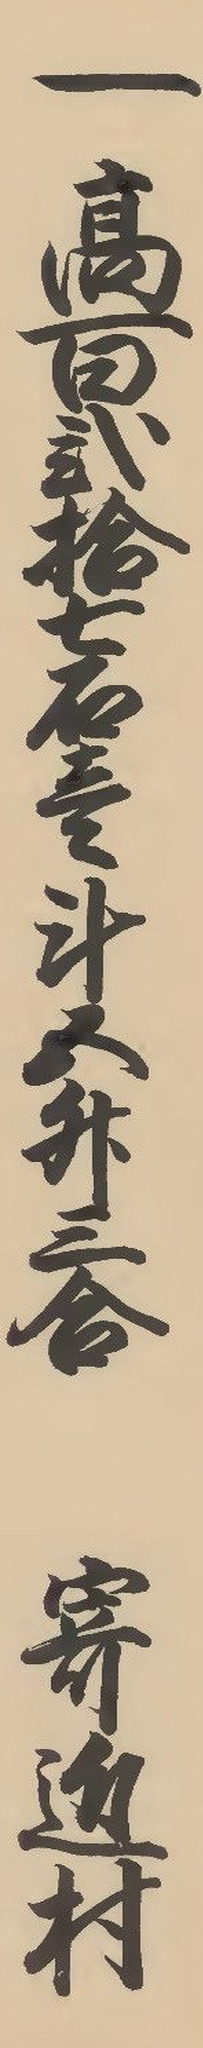一高百弐拾七石壱斗五升三合寄近村
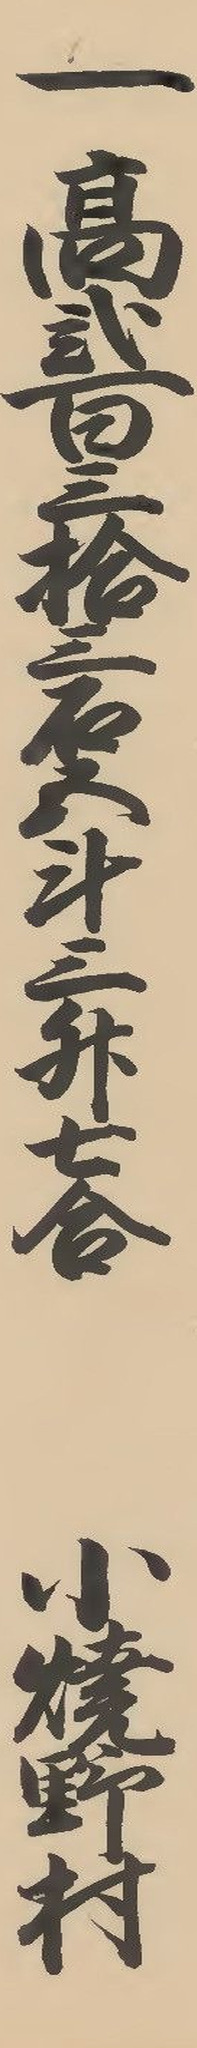一高弐百三拾三石五斗三升七合小焼野村
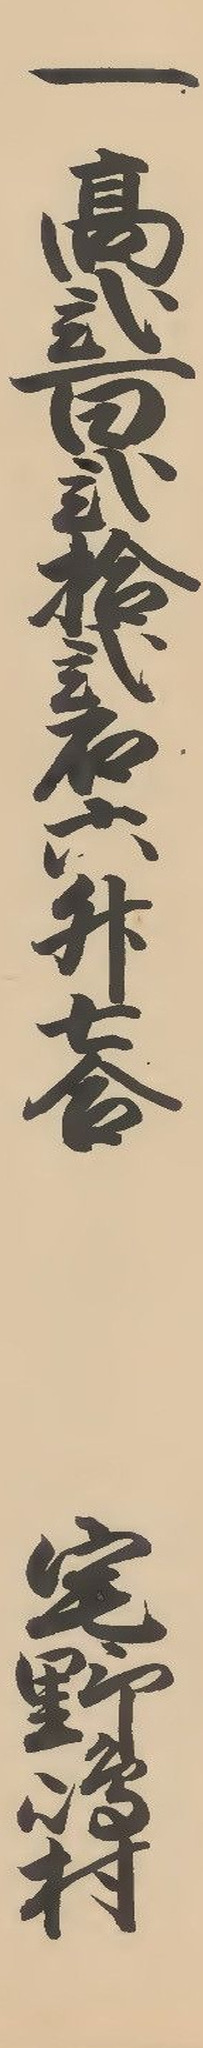一高弐百弐拾弐石六升七合宅野島村
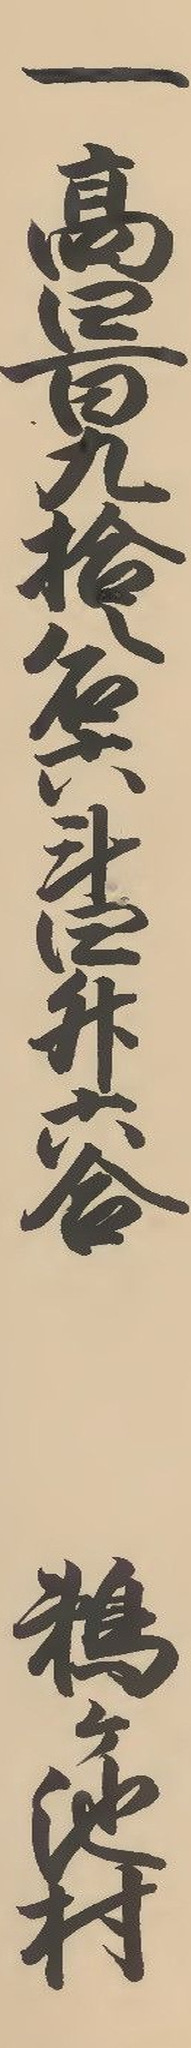一高四百九拾八石六斗四升六合鵜ヶ池村
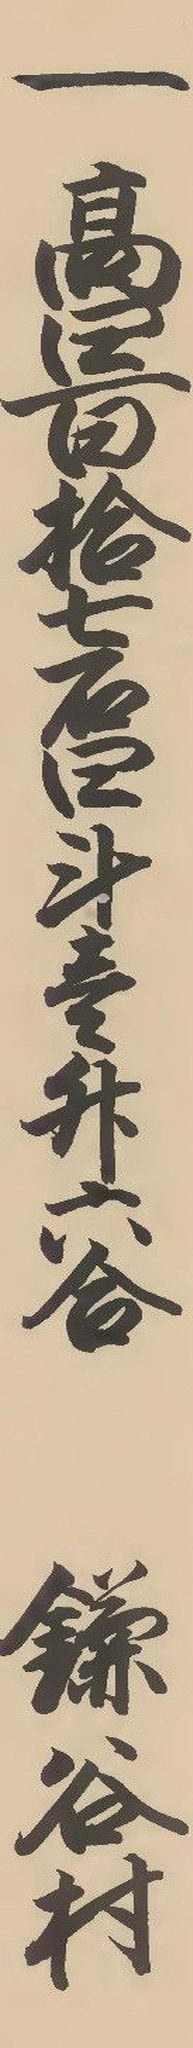一高四百拾七石四斗壱升六合鎌谷村
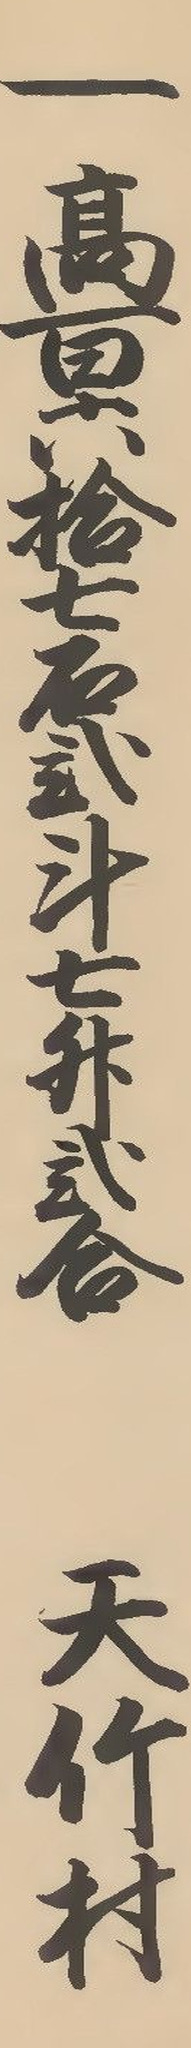一高百六拾七石弐斗七升弐合天竹村
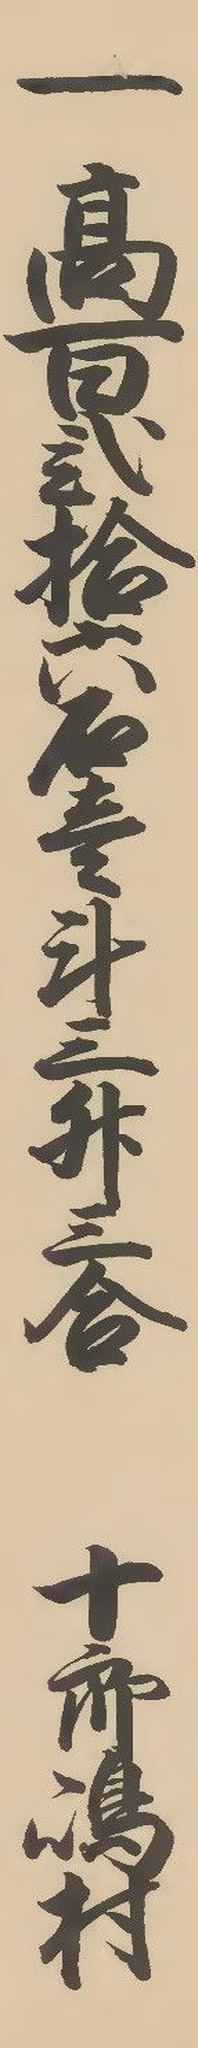一高百弐拾六石壱斗三升三合十郎島村
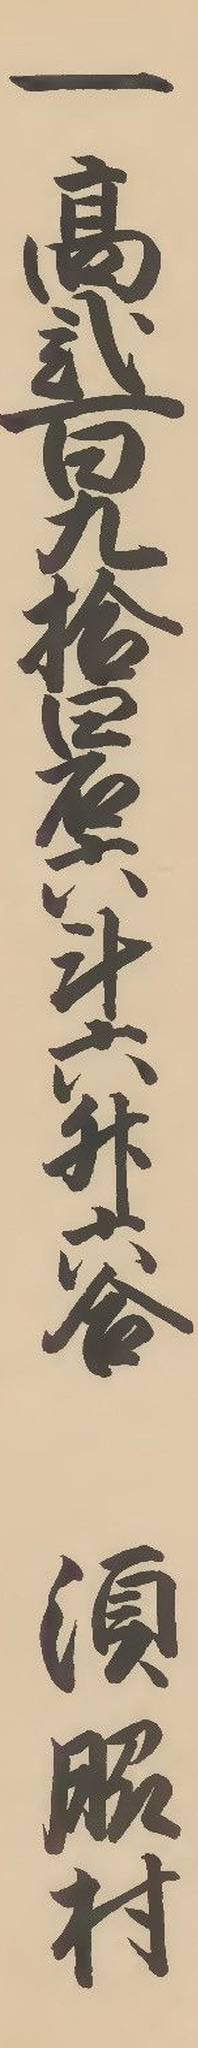一高弐百九拾四石六斗六升六合須脇村
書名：三河国郷帳
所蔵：国立公文書館 National Archives of Japan
